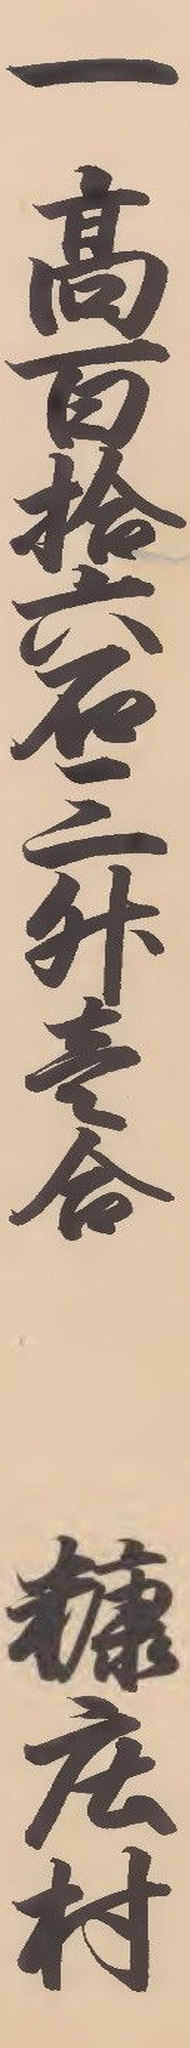一高百拾六石三升壱合糠庄村
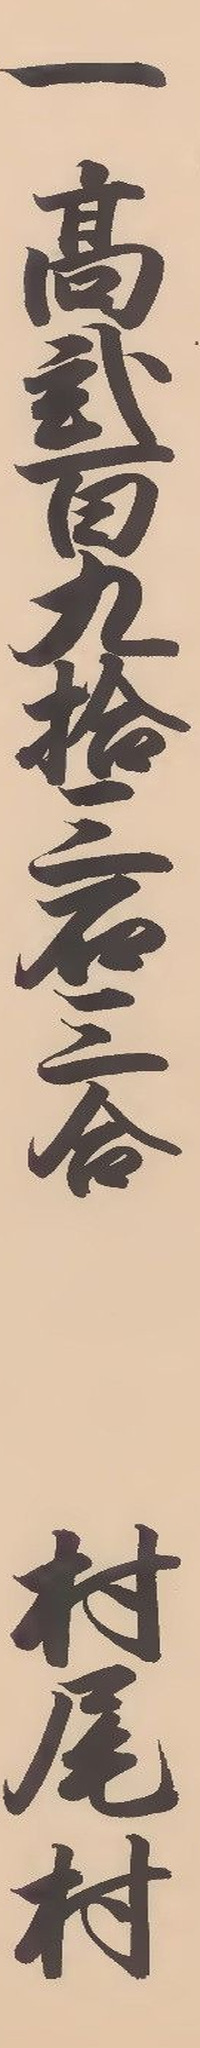一高弐百九拾三石三合村尾村
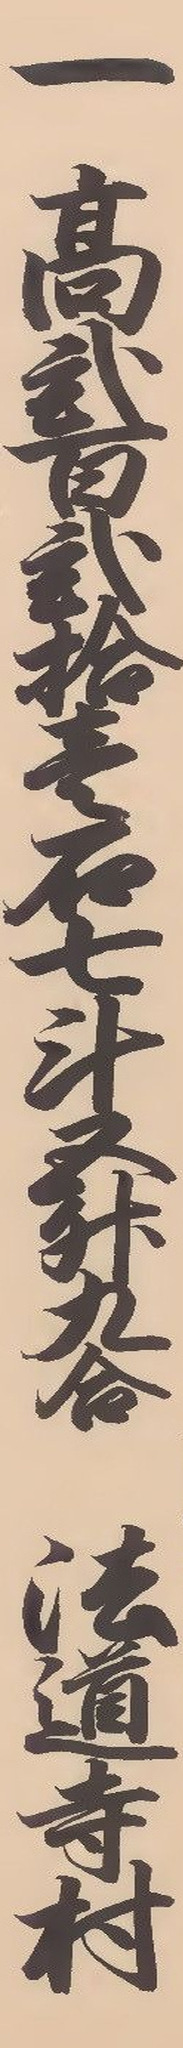一高弐百弐拾壱石五斗四升三合生山村
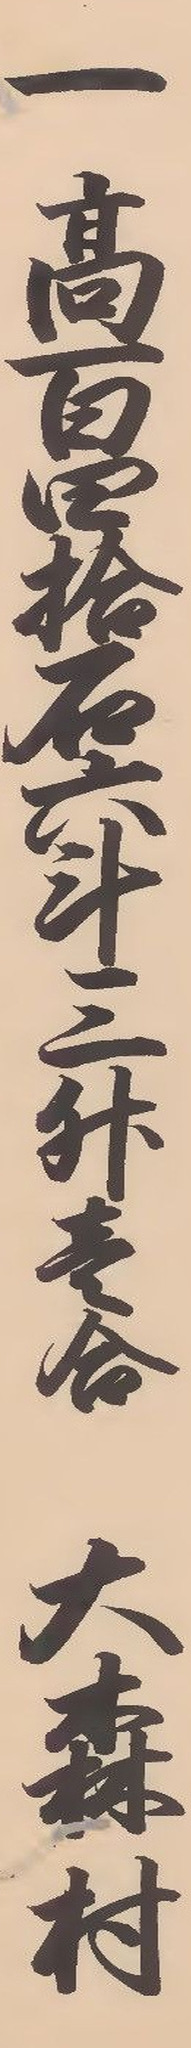一高百四拾石六斗三升壱合大森村

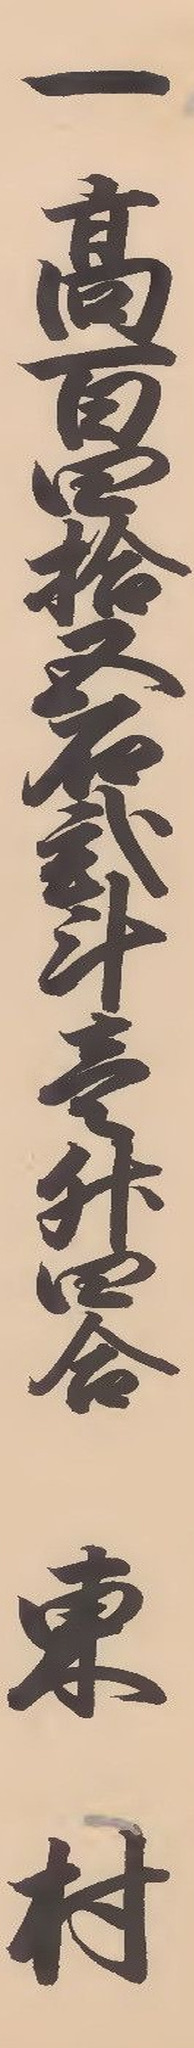一高百四拾五石弐斗壱升四合東村
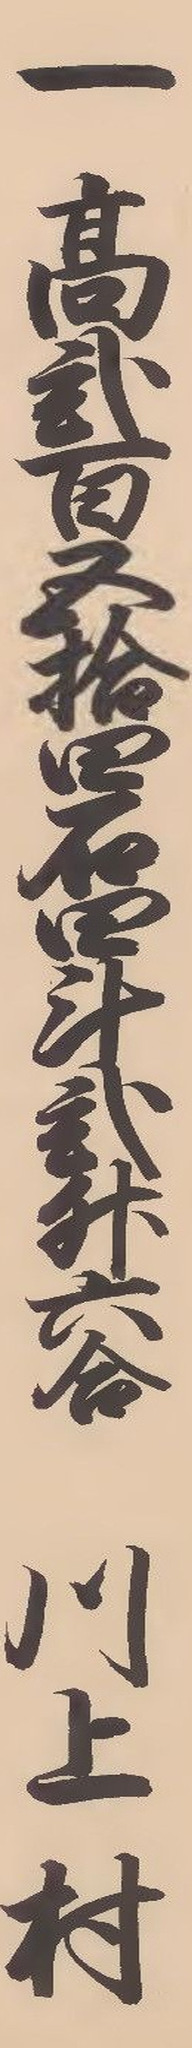一高弐百五拾四石四斗弐升六合川上村
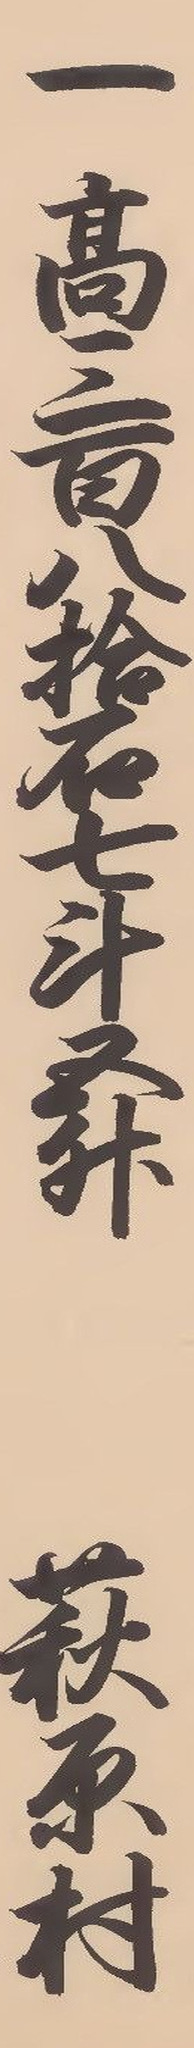一高三百八拾石七斗五升萩原村
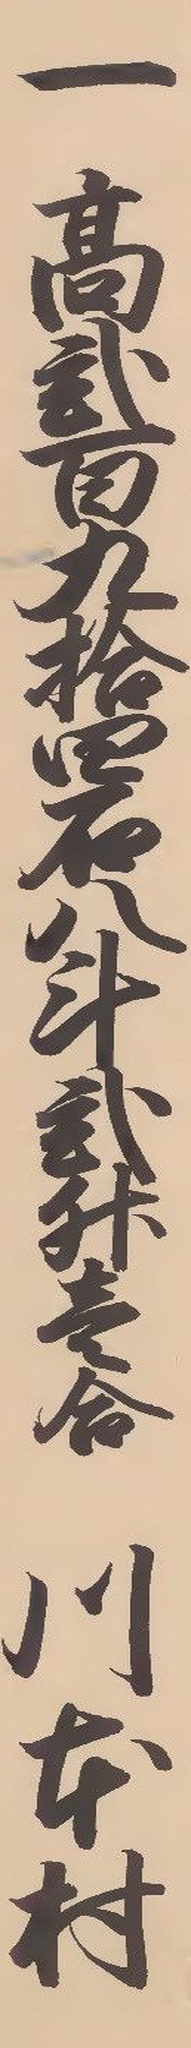一高弐百九拾四石八斗弐升壱合川本村
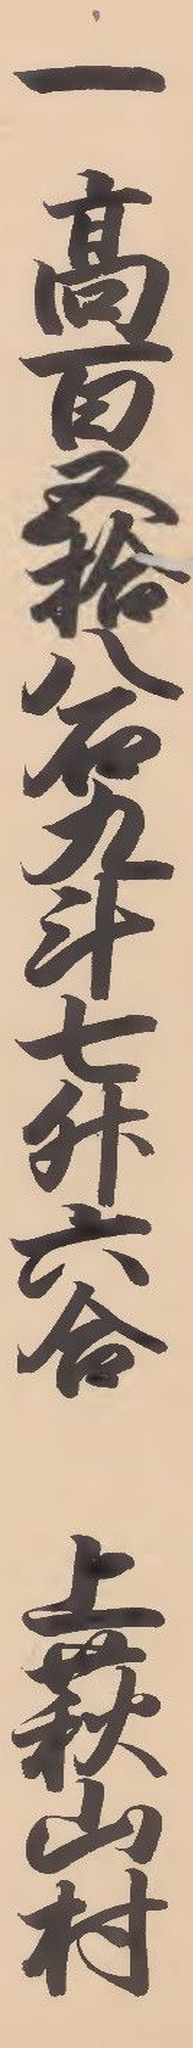一高百五拾八石九斗七升六合上萩山村
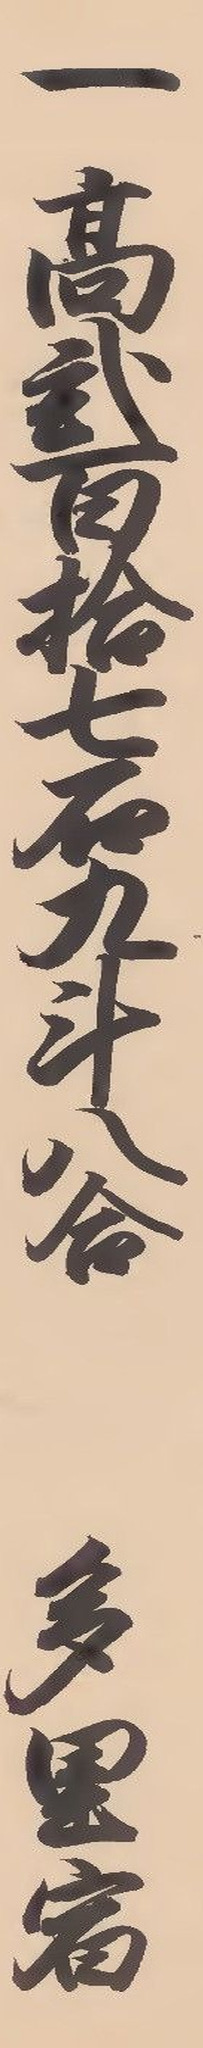一高弐百拾七石九斗八合多里宿
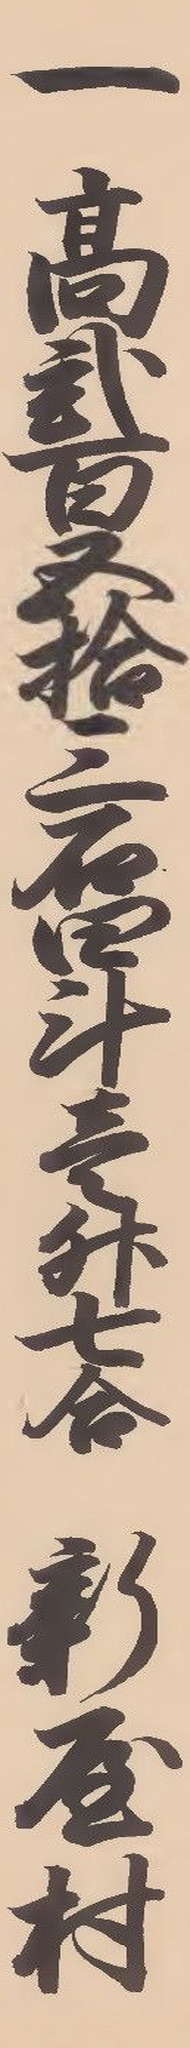一高弐百五拾三石四斗壱升七合新屋村
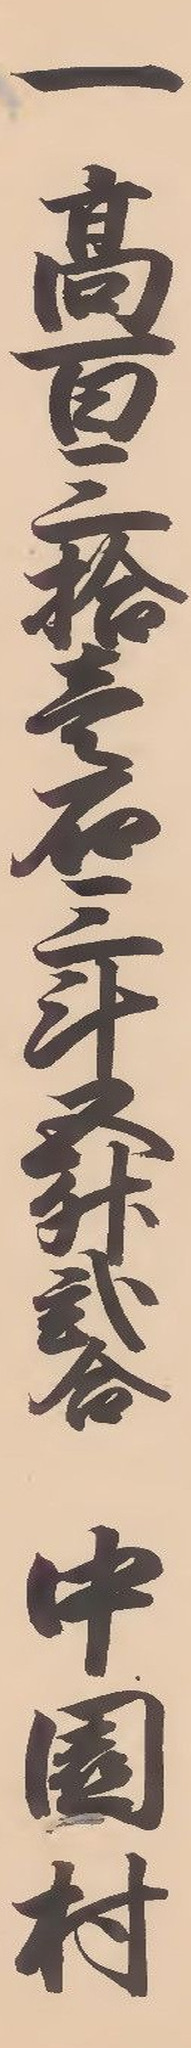一高百三拾壱石三斗五升弐合中園村

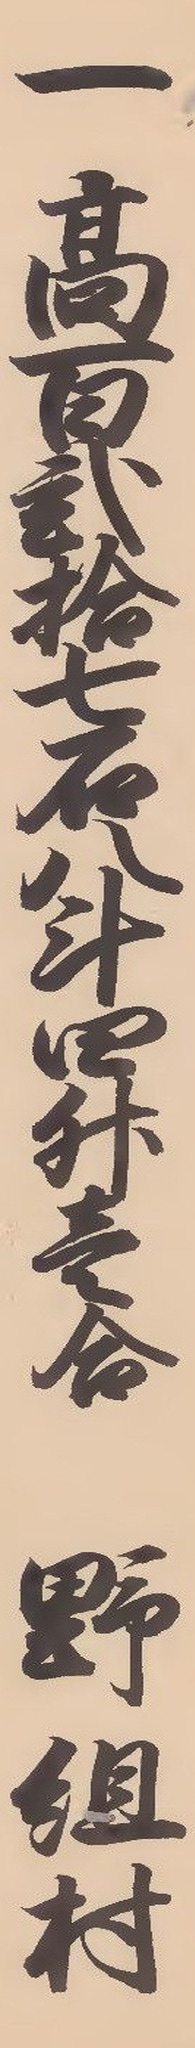一高百弐拾七石八斗四升壱合野組村
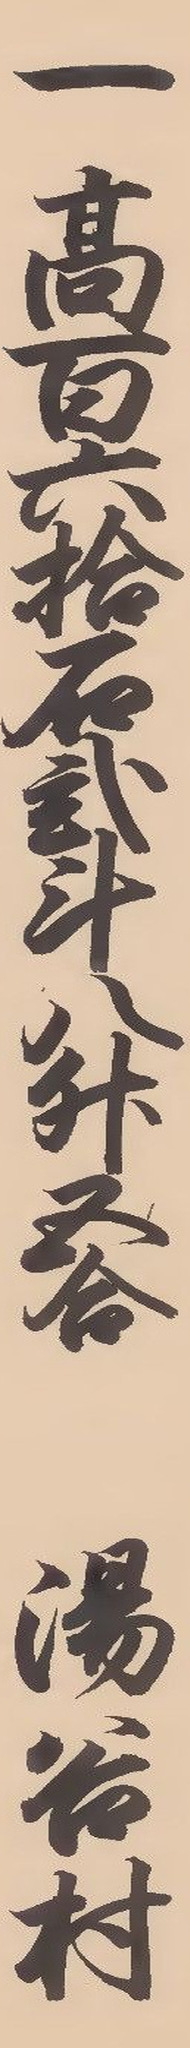一高百六拾石弐斗八升五合湯谷村
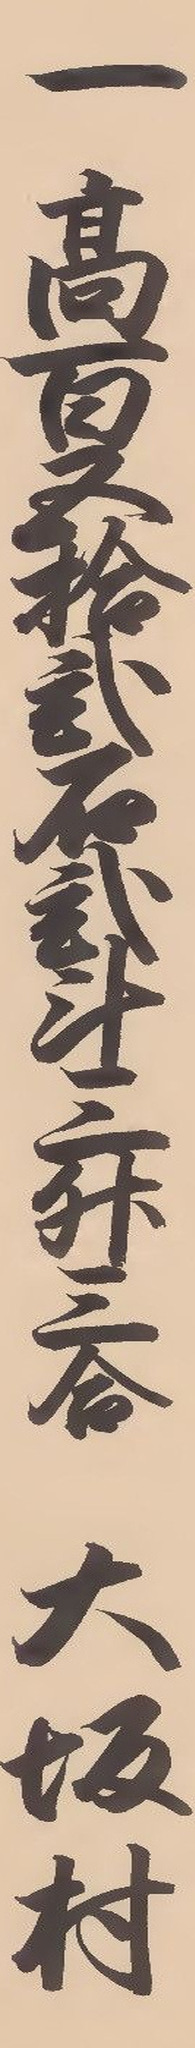一高百五拾弐石弐斗三升三合大坂村
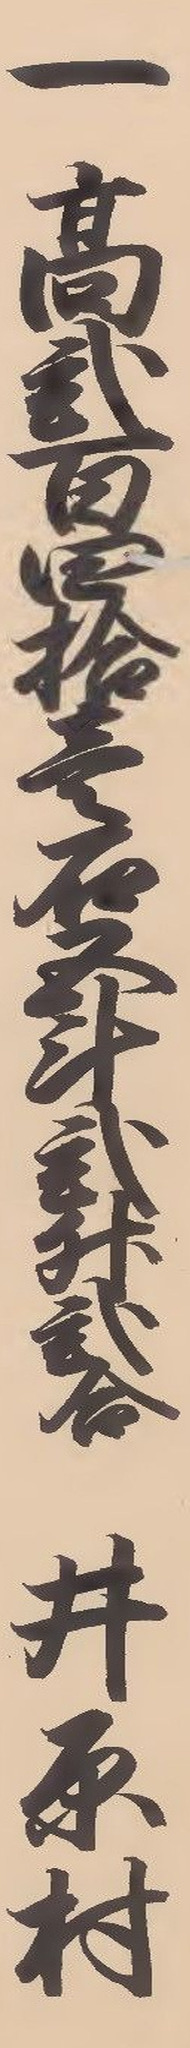一高弐百四拾壱石五斗弐升弐合井原村
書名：伯耆国郷帳
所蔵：国立公文書館 National Archives of Japan
